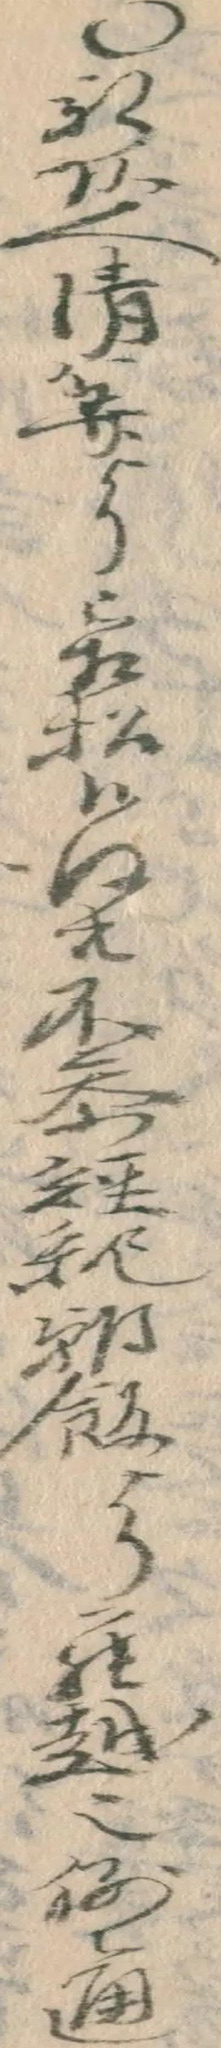○新頭人清算より被相招候得共不参経紀朝飯より罷越也例之通
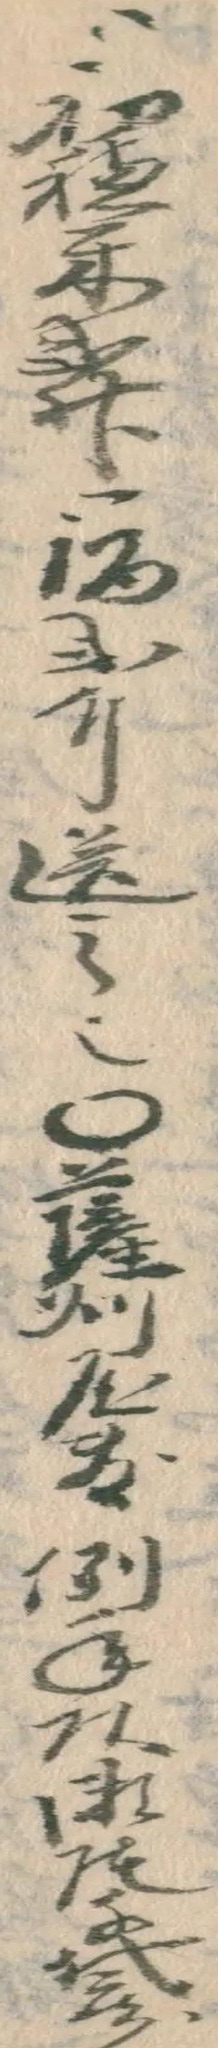御初穂米弐升一酒弐斤送之也○薩州屋敷例年頭瀬尾千代蔵
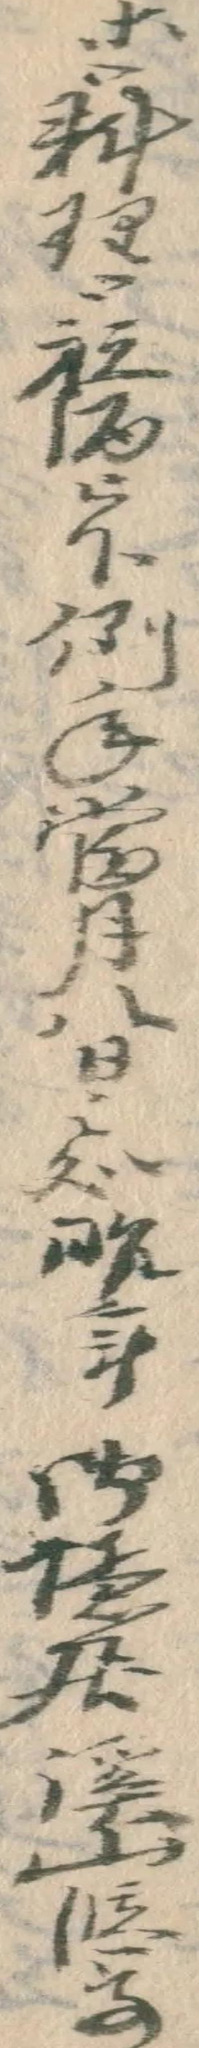等御料理御祝酒被下例年當月八日之処昨年御隠居渓山段
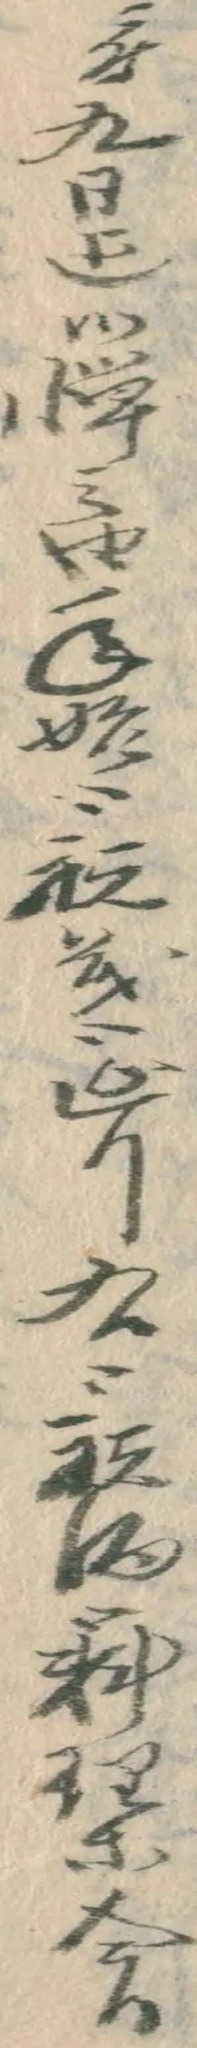ニ付九日迄御憚之由年始ハ祝義御延引右御祝酒御料理等今日
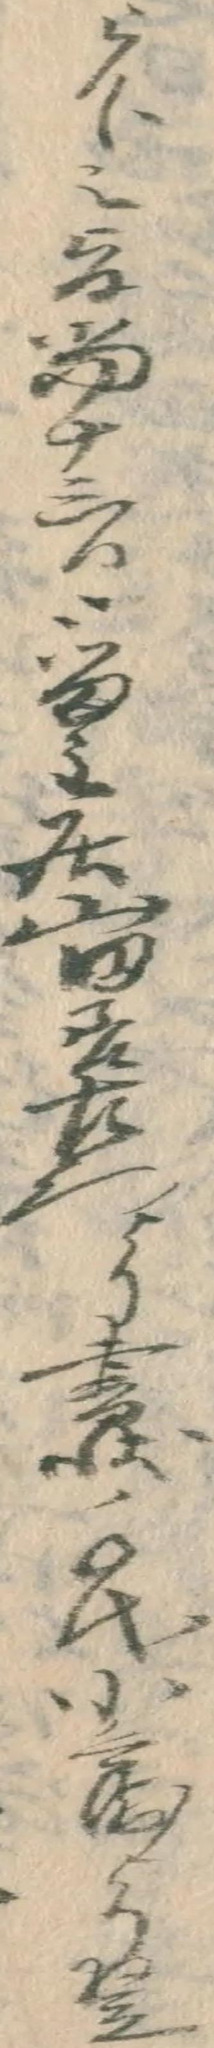被下之旨當十三日御留守居山田善左衛門より書状手代小富より翌
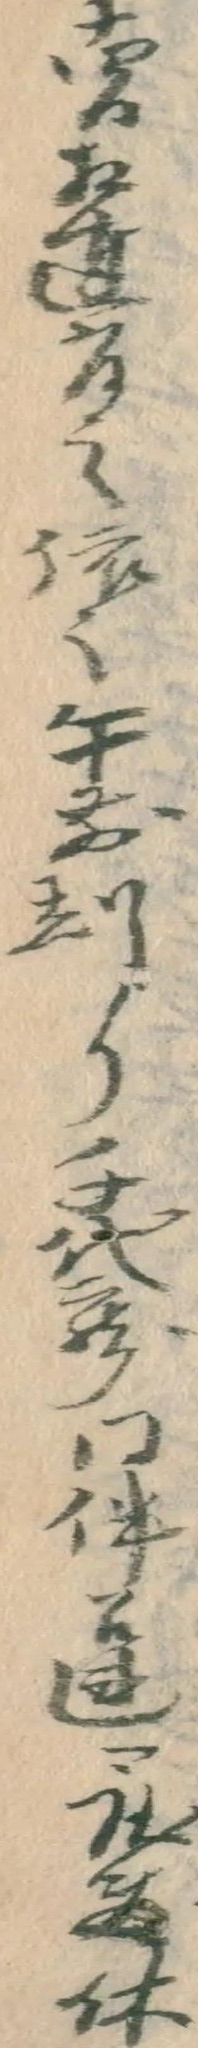十四日相達有之依之午前刻より千代蔵同伴召連御座敷休

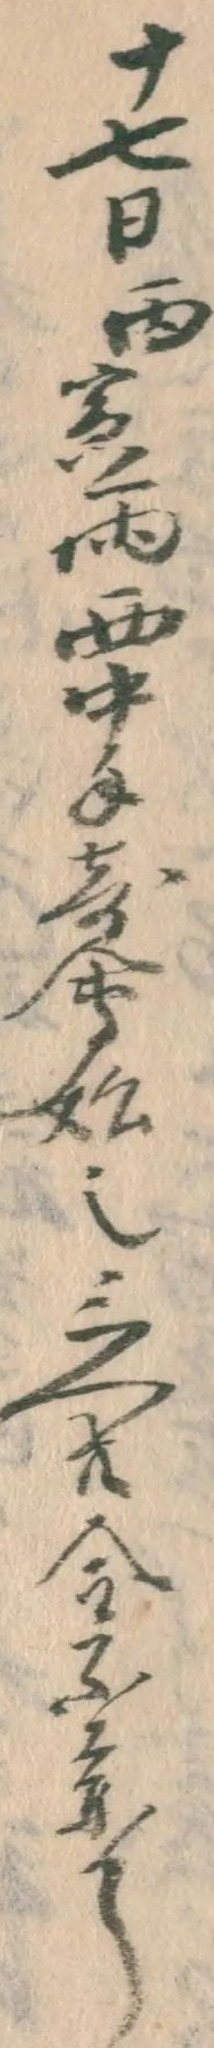十七日丙寅雨西中手寄會始也三人共令不参了
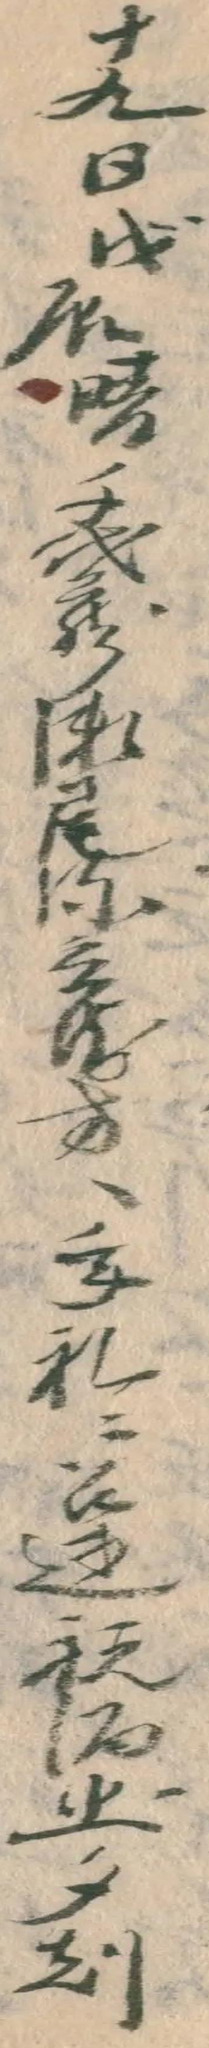十九日戊辰晴千代蔵瀬尾弥兵衛方へ年礼ニ召連祝酒出夕刻
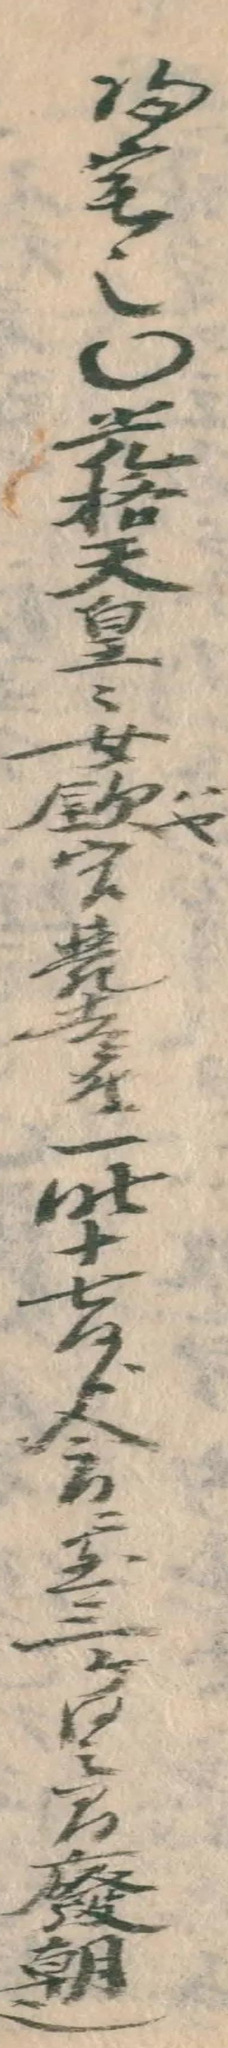帰宅也〇光格天皇々女欽宮薨去ニ付一昨十七日ゟ今日ニ至三ケ日之間廢朝也
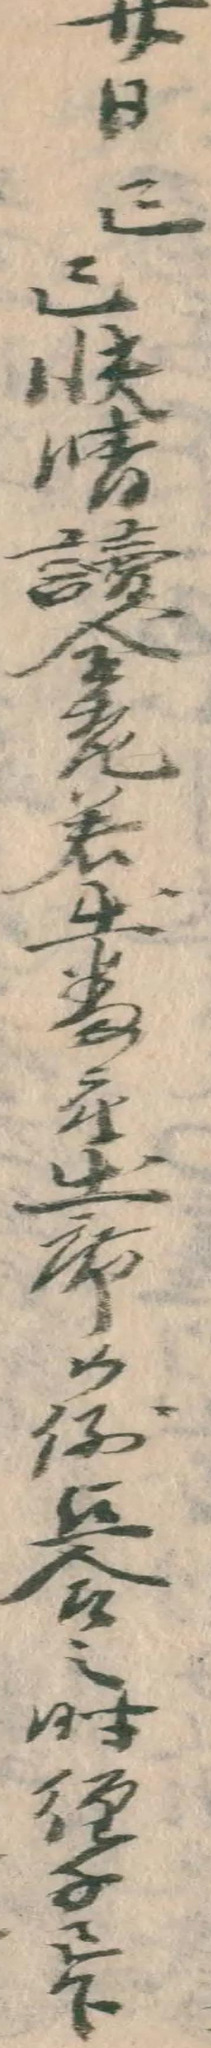廿日己巳快晴讀合老若出番ニ付出席如例点合之時経子已下
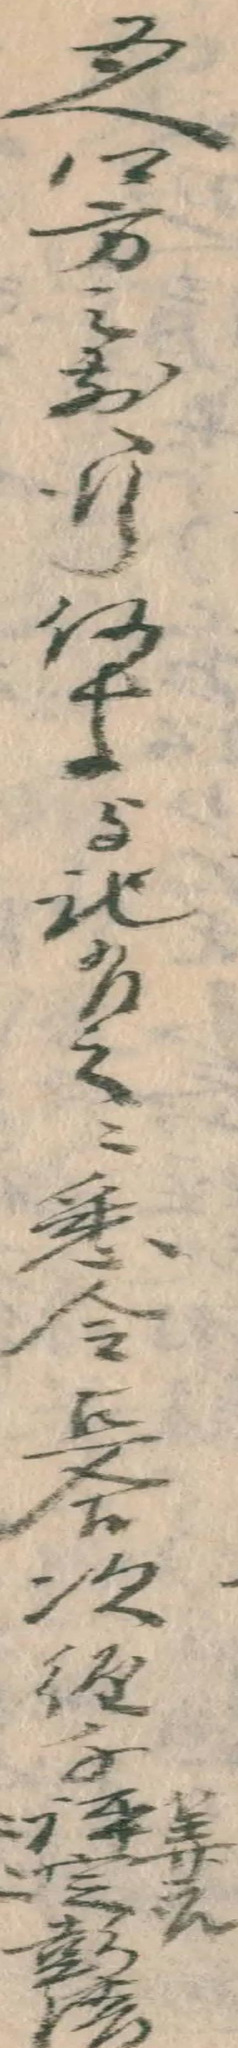五人郷方之前へ引何千と記有之に悉令点合次経千算取彭清
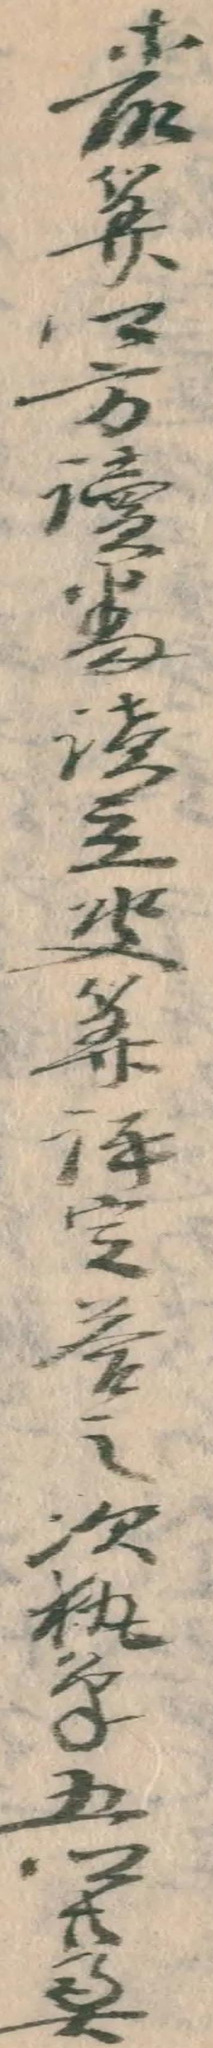等取算四方讀番讀立決算評定答之次執筆五郷共奥
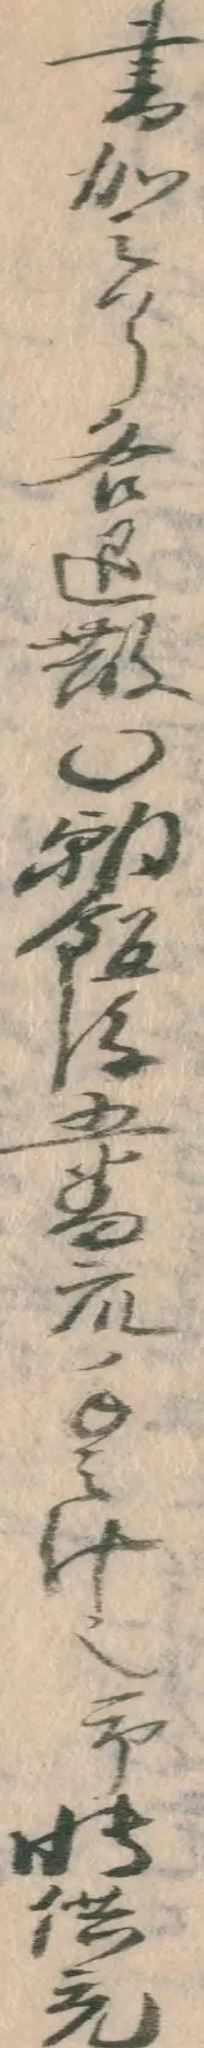書加之了各退散○朝飯後五番衆手之汁也予轉供充
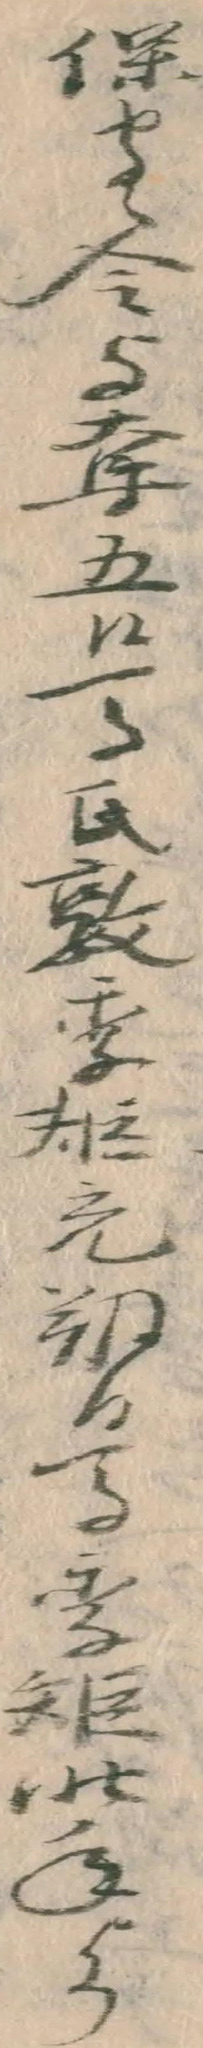保守ヘ令与奪五日馬氏敦季矩充朔日馬季矩昨年より
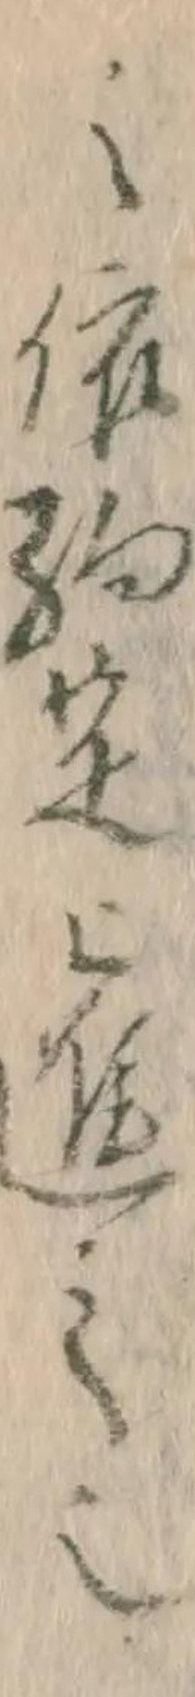之依約定被進之也
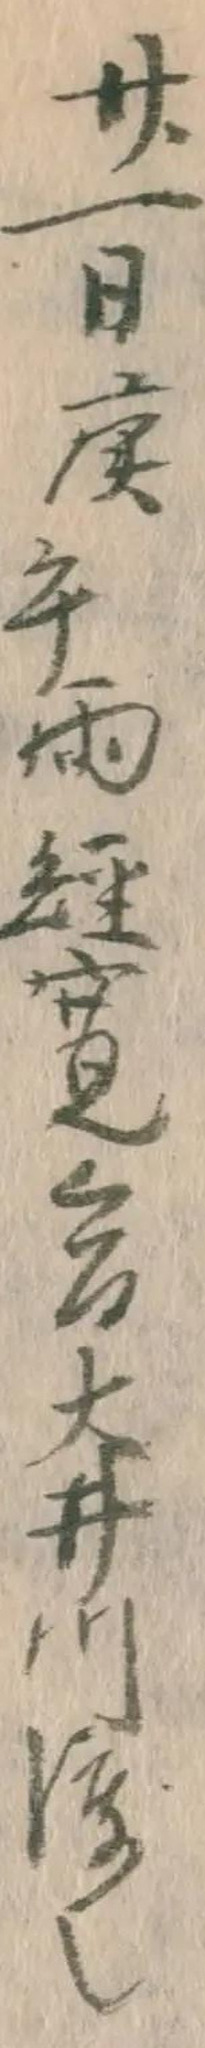廿一日庚午雨経寛今日大井川渡也
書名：賀茂社記録. 第69冊
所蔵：国立国会図書館 National Diet Library, JAPAN
